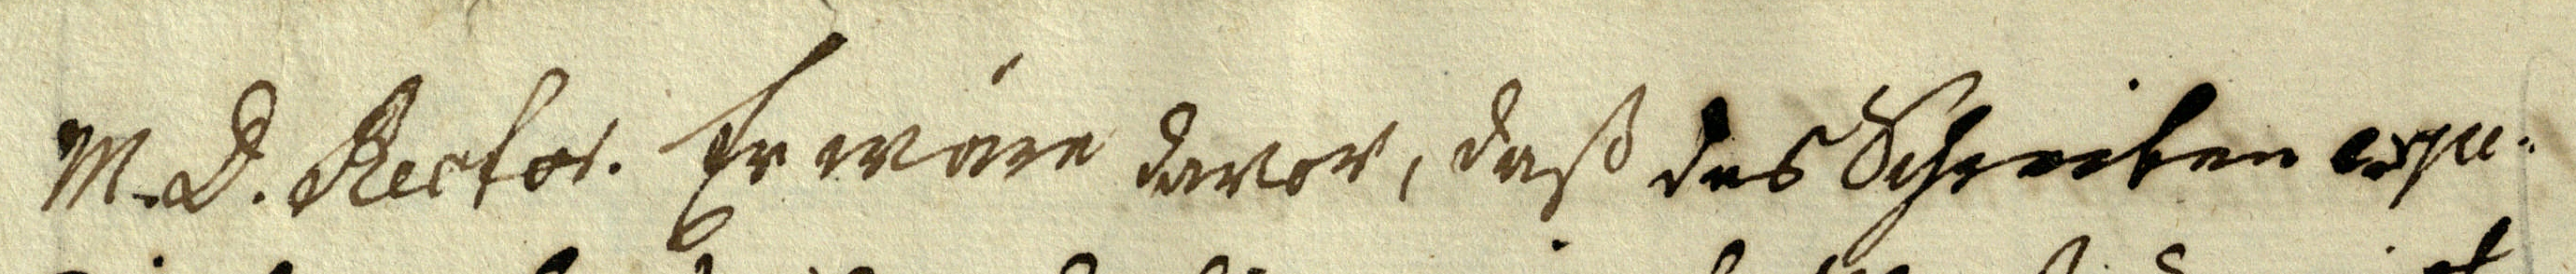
M. D. Rector. Er wäre davor, daß das Schreiben expe¬
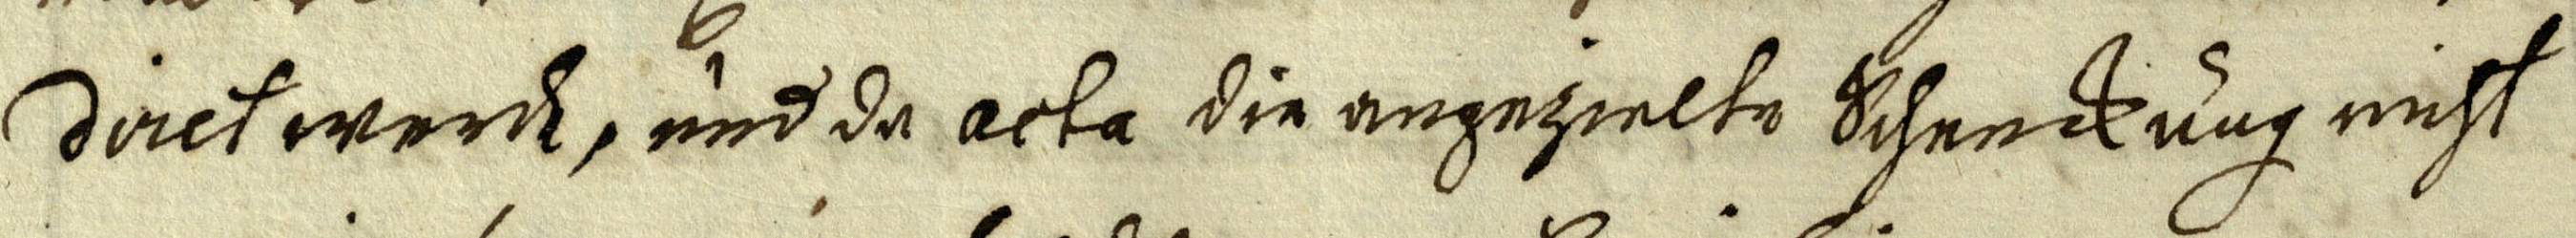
diret werde, und da acta die angezielte Schenckung nicht
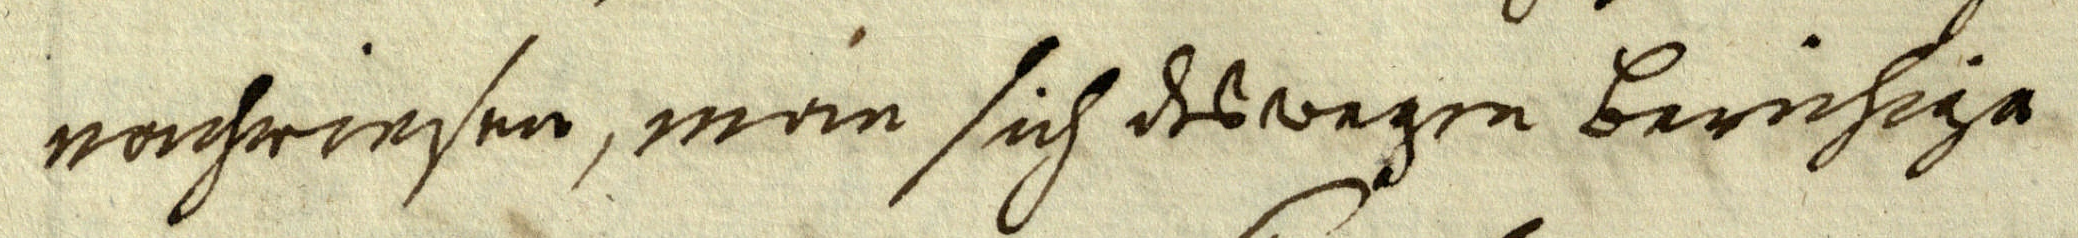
nachwiesen, man sich deswegen beruhige
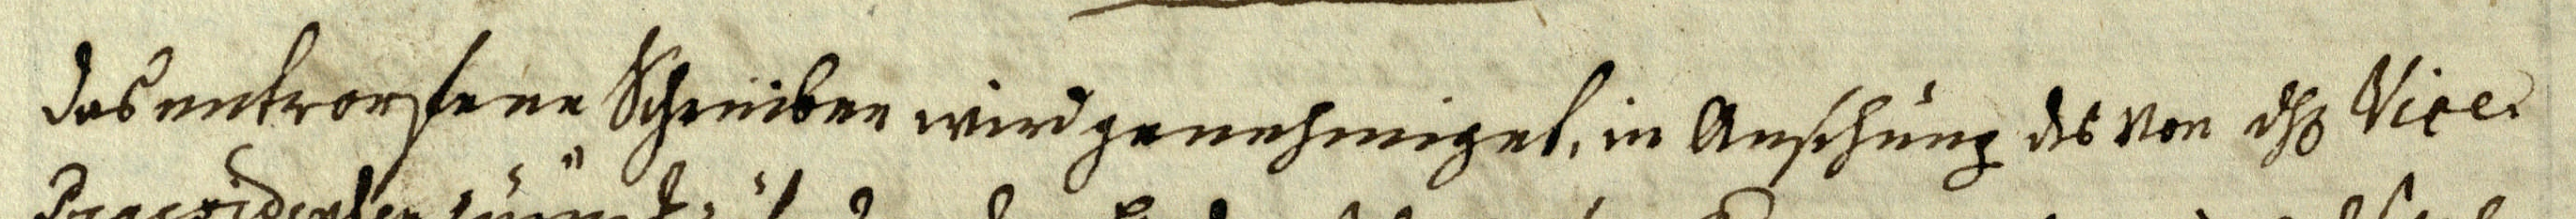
das entworfene Schreiben wird genehmiget, in Ansehung des von dh Vice¬
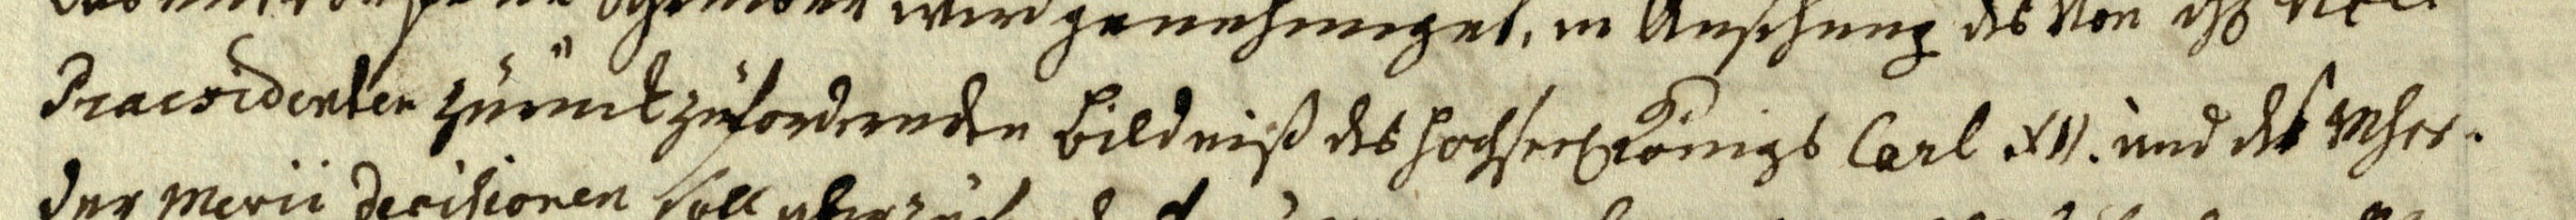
Praesidenten zurückzufordernden Bildniß des hochseel. Königs Carl XII. und des mscr.
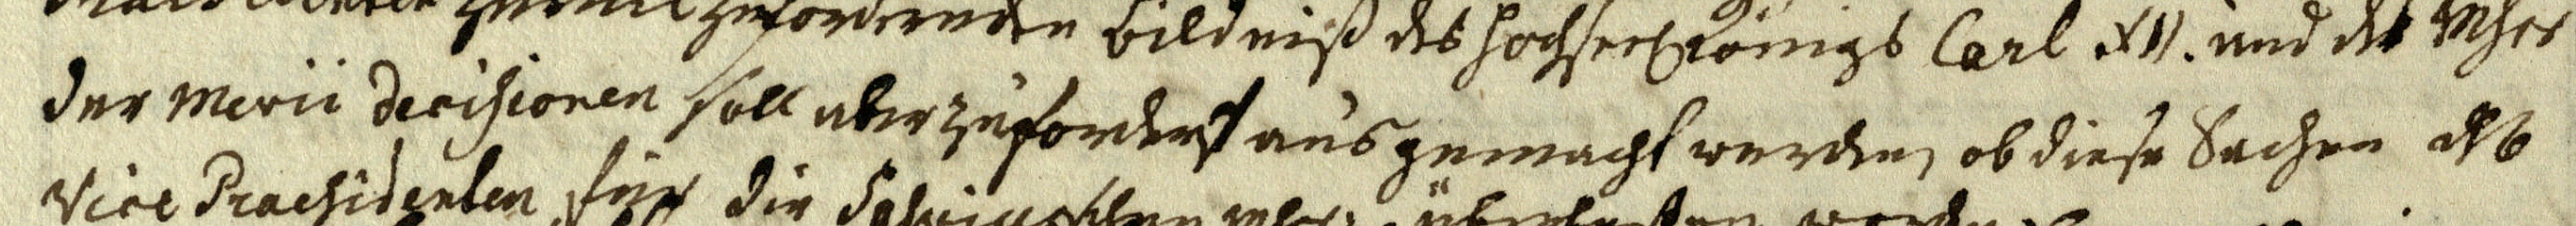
der Mevii decisionen soll aber zuforderst ausgemacht werden, ob diese Sachen dh
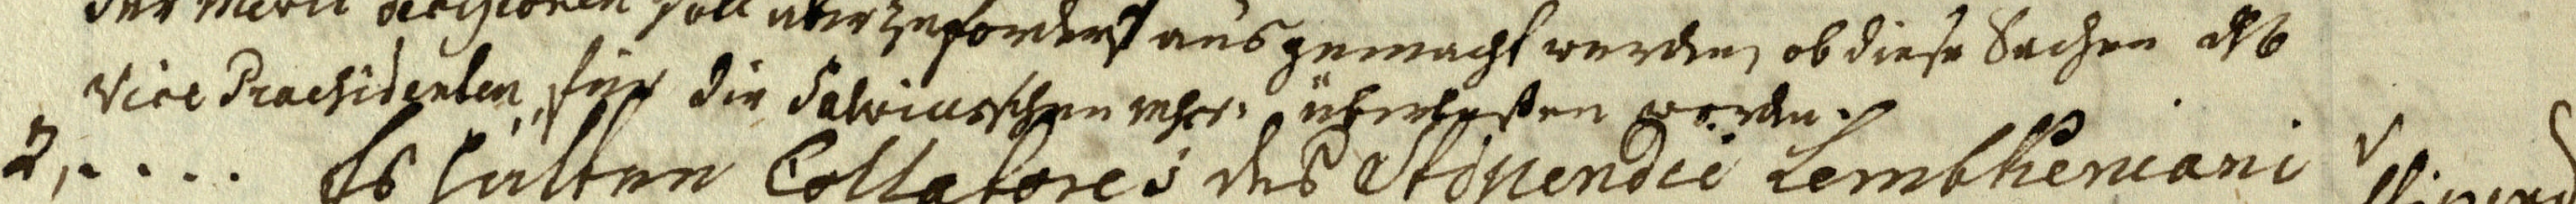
Vice Praesidenten für die Salviusschen mscr. überlaßen werden.
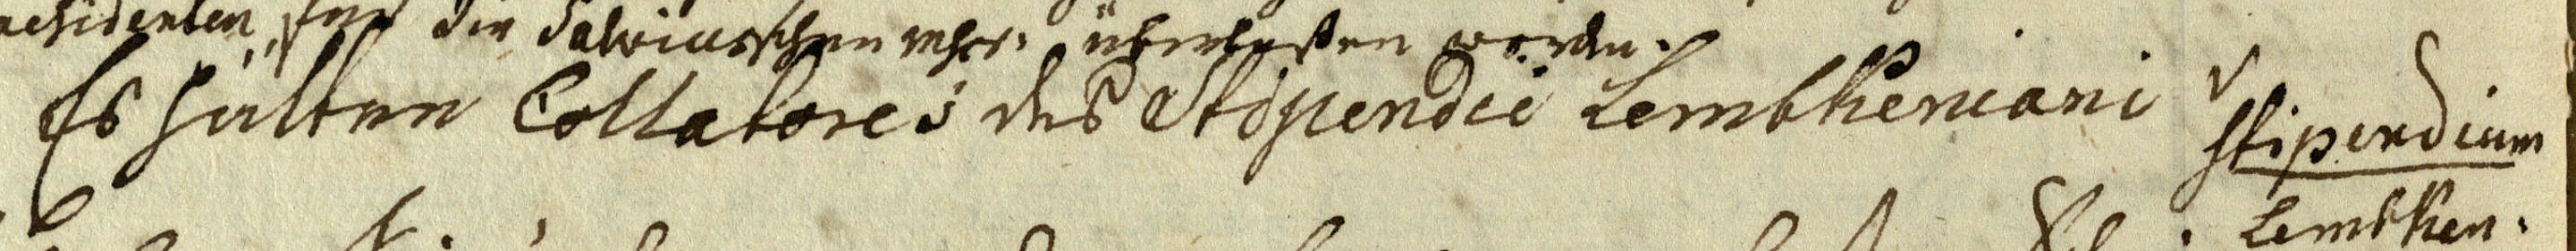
2. Es hätten Collatores des Stipendii Lembkeniani Stipendium
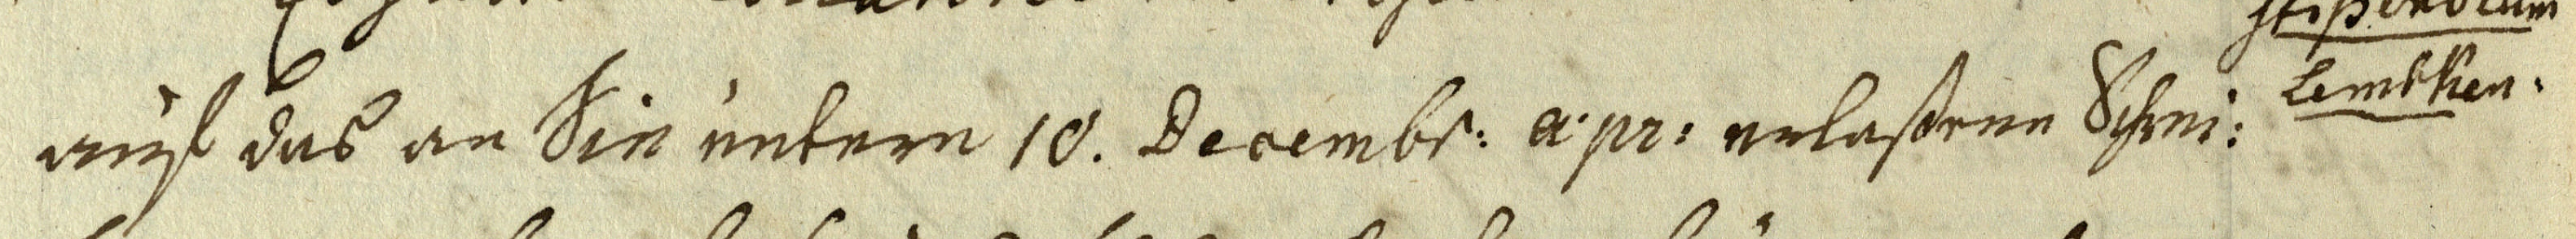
auf das an Sie untern 10. Decembr. a. pr. erlaßene Schrei¬ Lembken
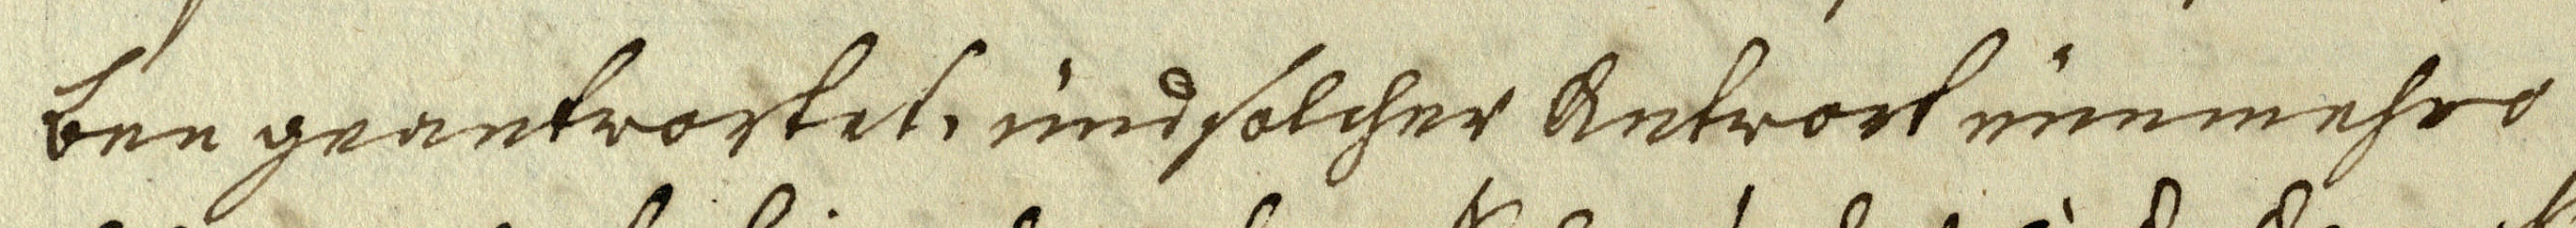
ben geantwortet und solcher Antwort nunmehro
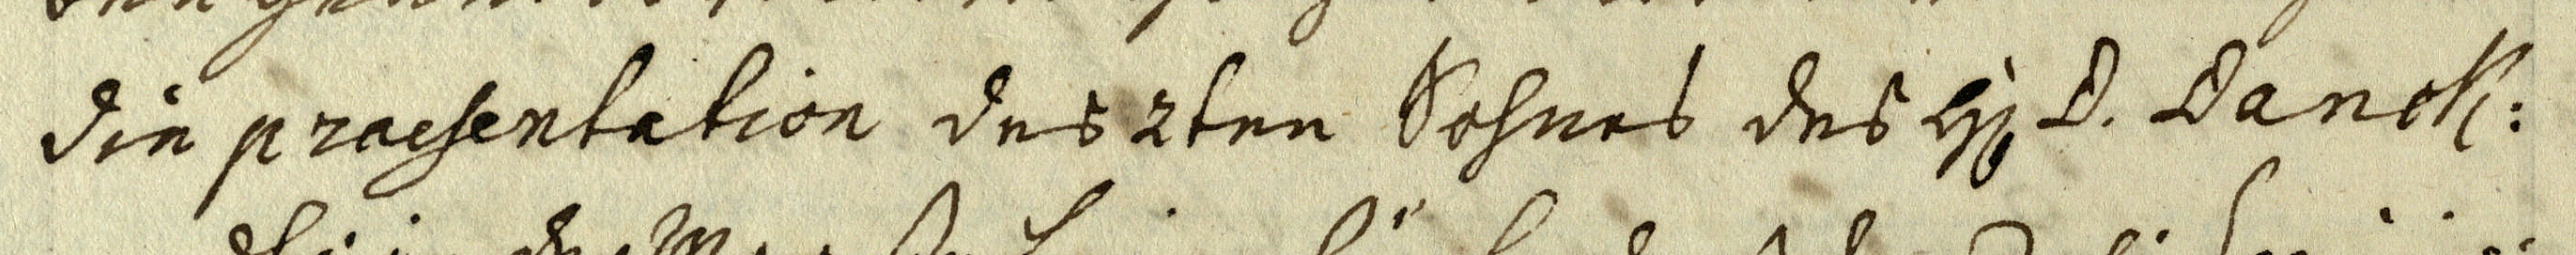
die praesentation des 2 ten Sohnes des H. D. Danck¬
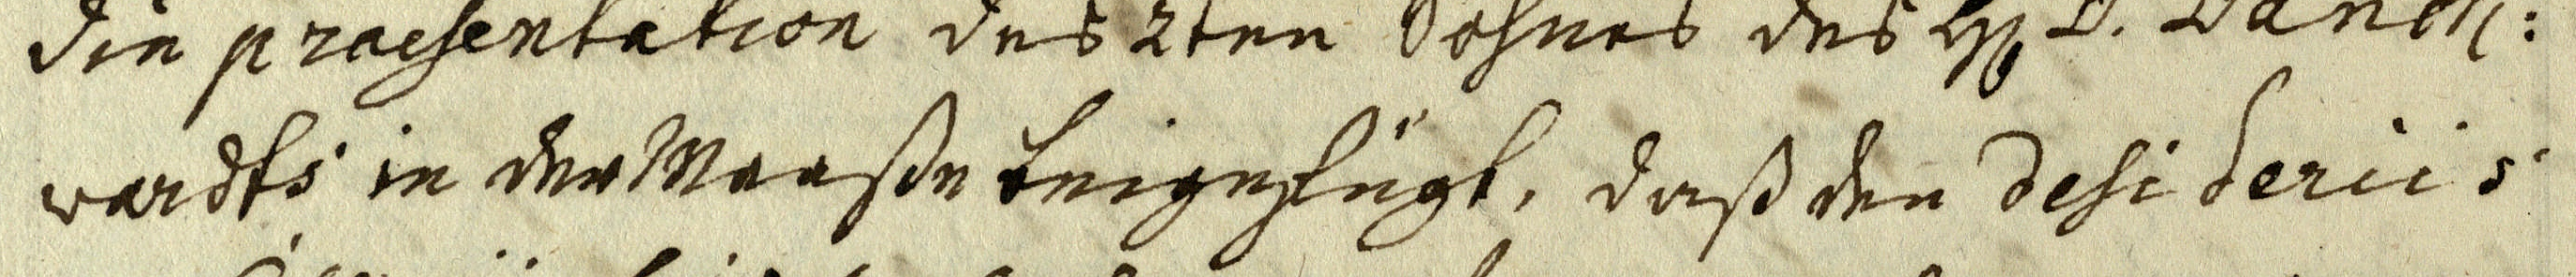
wardts in der Maaße beeigefügt, daß den desideriis
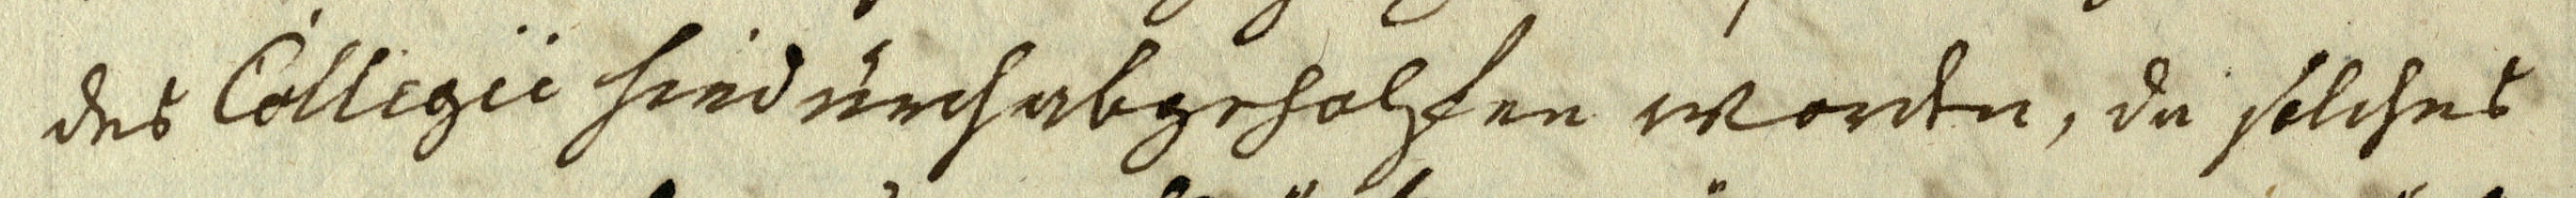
des Collegii hiedurch abgehalten worden, da solches
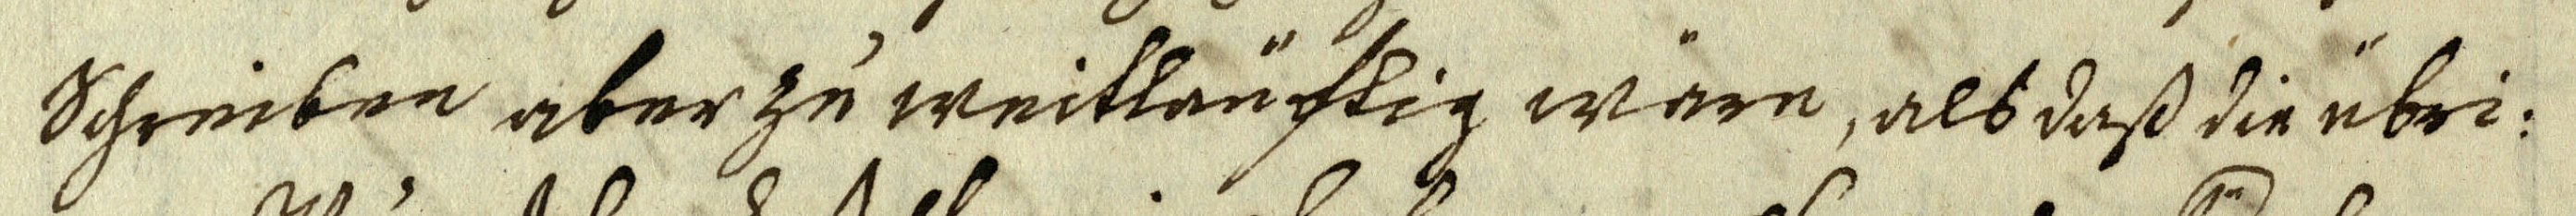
Schreiben aber zu weitläuftig wäre, als daß die übri¬
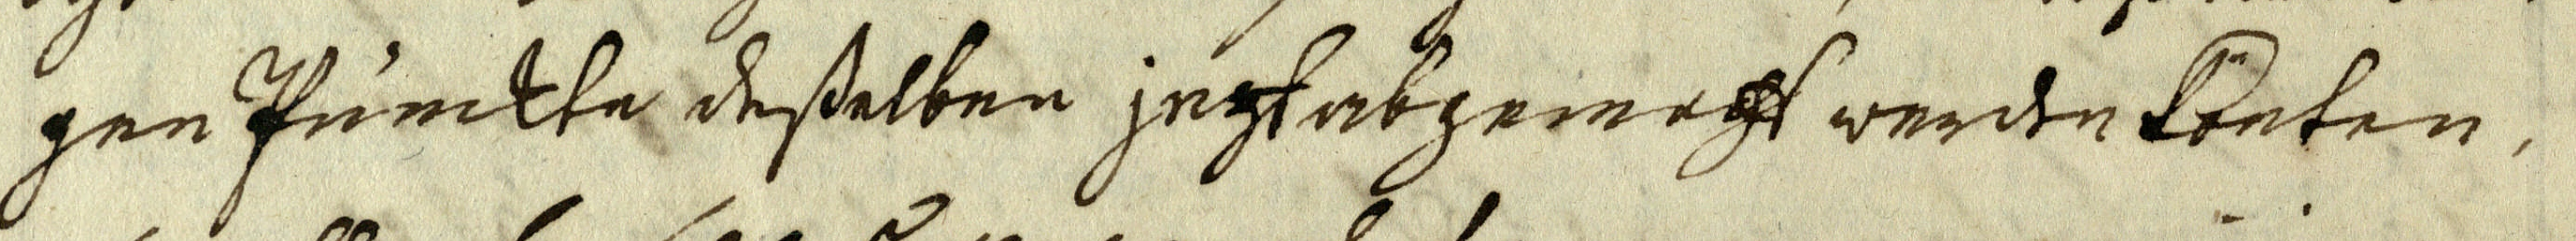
gen Punckte deßelben jezt abgemacht werden könten,
